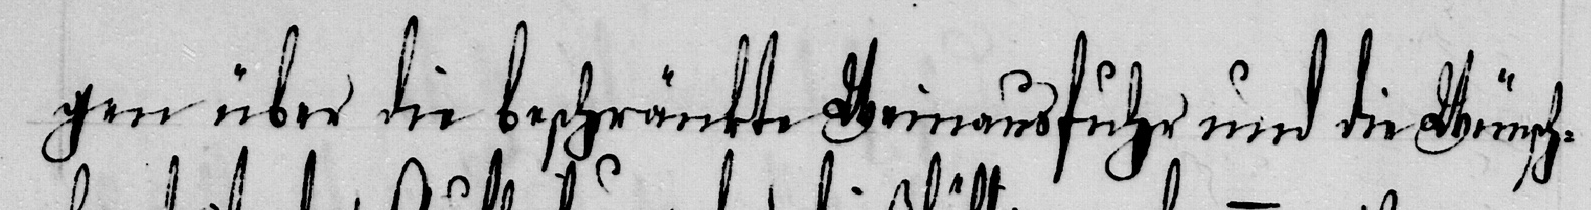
gen über die beschränkte Weinausfuhr und die Wünsc¬
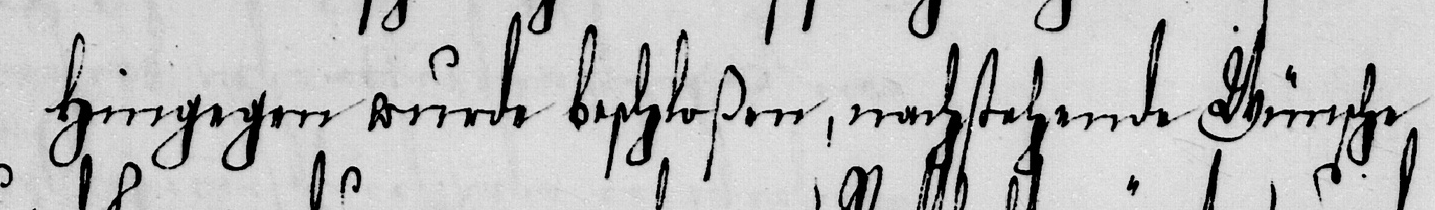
Hingegen wurde beschloßen, nachstehende Wünsche
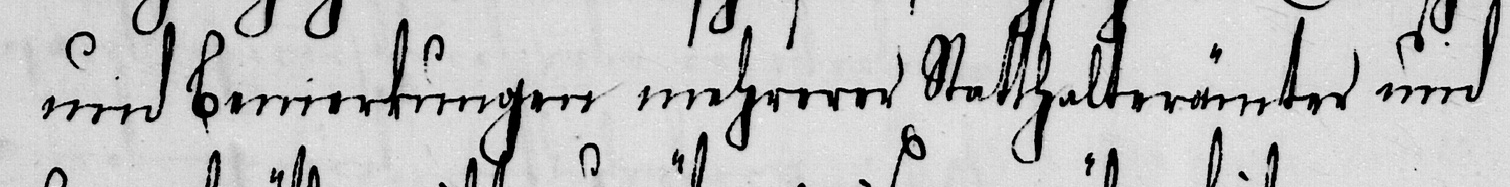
und Bemerkungen mehrerer Statthalterämter und
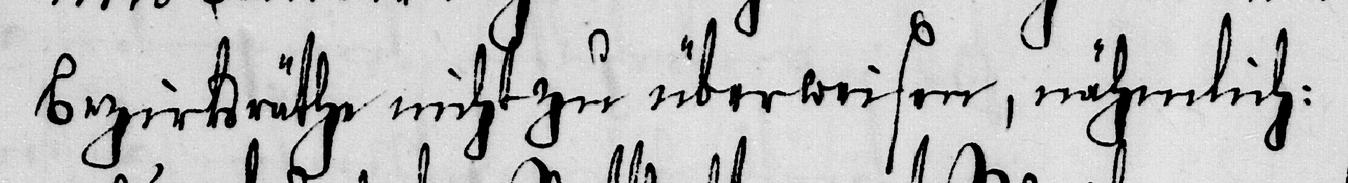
Bezirksräthe nicht zu überweisen, nähmlich:
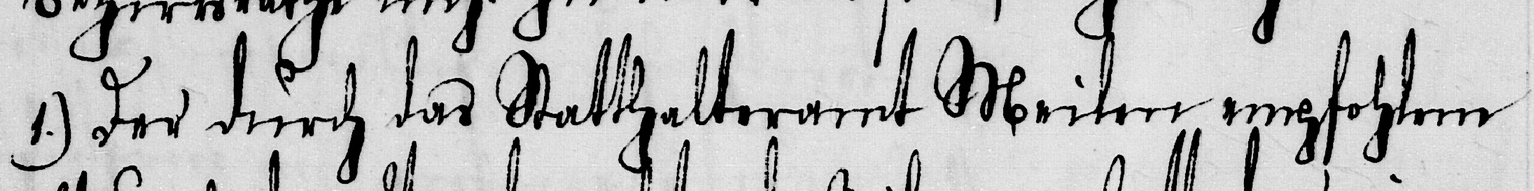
1.) Der durch das Statthalteramt Meilen empfohlene
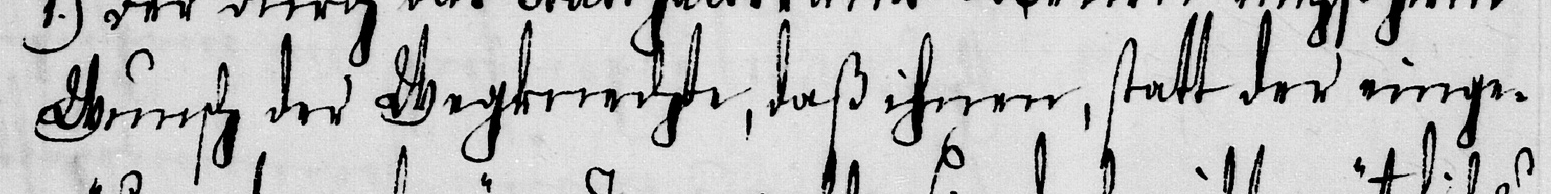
Wunsch der Wegknechte, daß ihnen, statt der einge¬
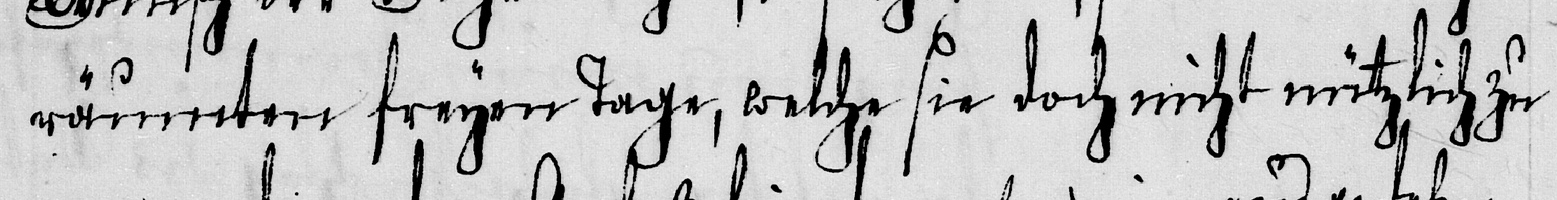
räumten freiyen Tage, welche sie doch nicht nützlich zu
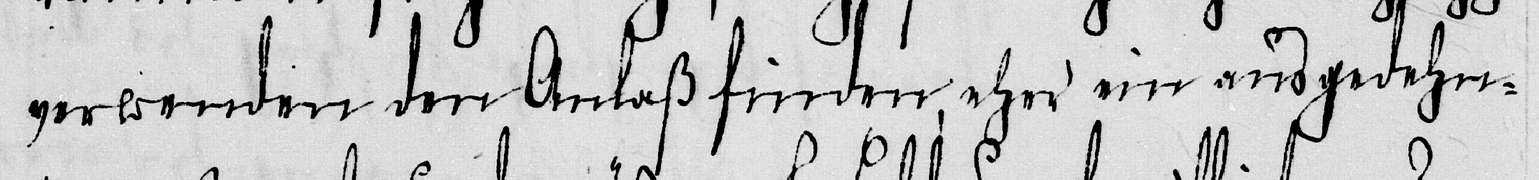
verwenden den Anlaß finden, eher ein ausgedehn¬
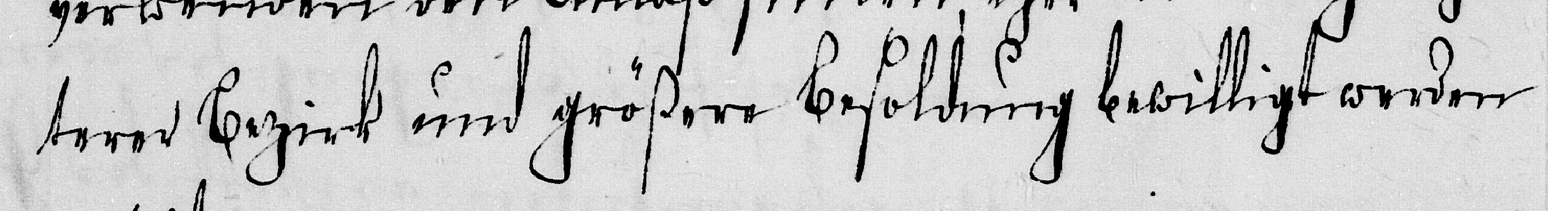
terer Bezirk und größere Besoldung bewilligt werden
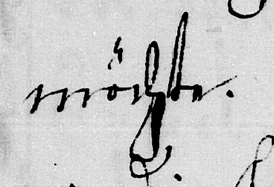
möchte.
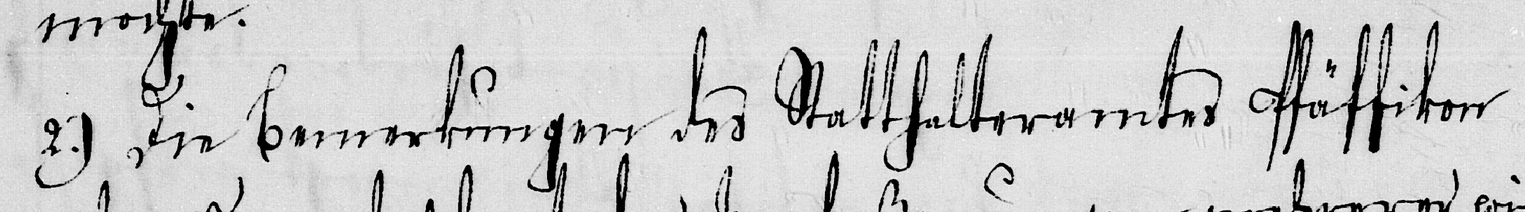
2.) Die Bemerkungen des Statthalteramtes Pfäffikon
